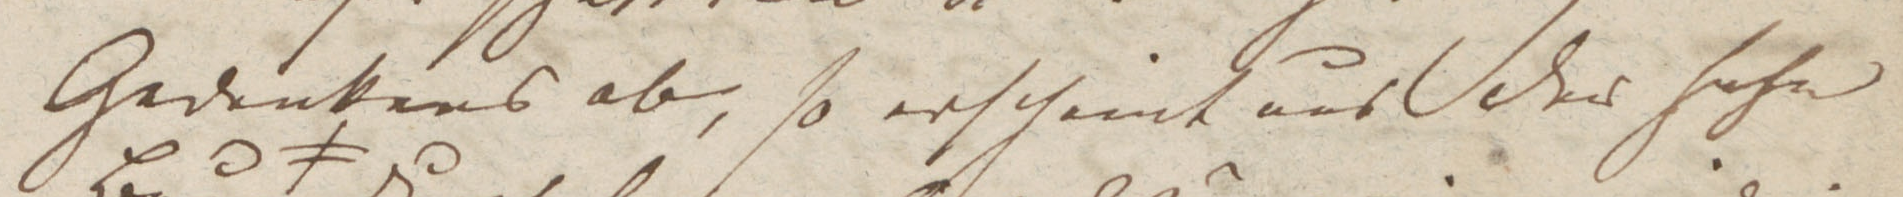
Gedankens ab, so erscheint uns der hohe
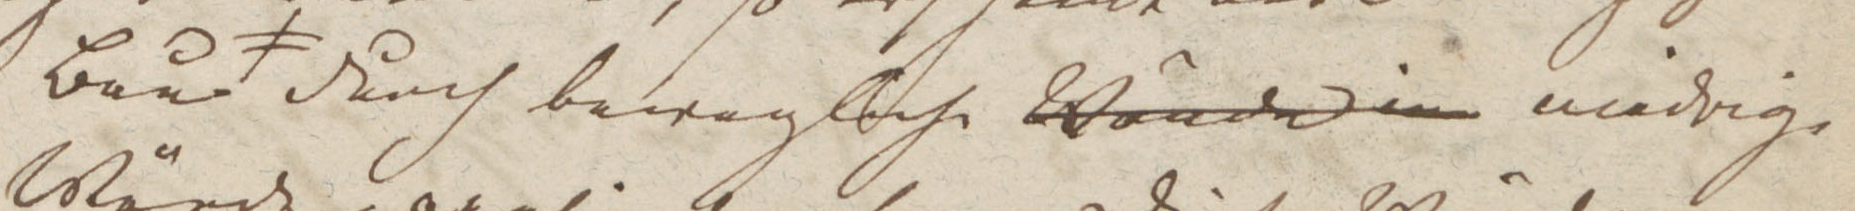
Bau % durch beweglich Wände im niedrig
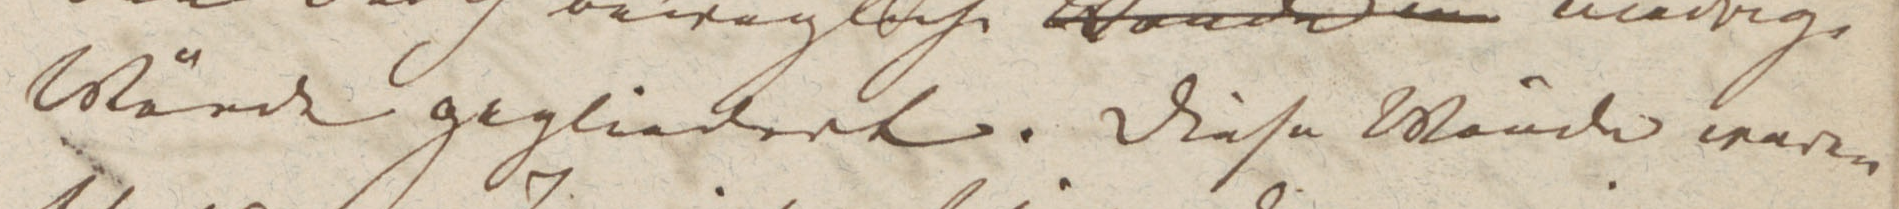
Wände gegliedert. Diese Wände waren
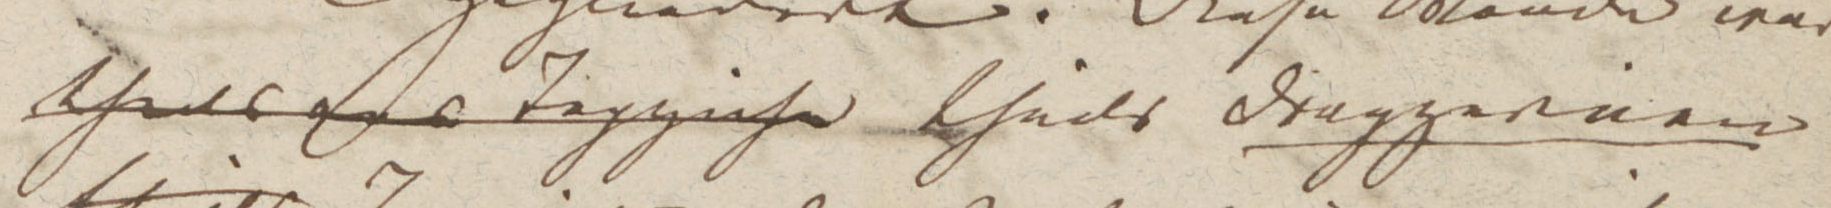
theils aus Teppich theils Drapperieen
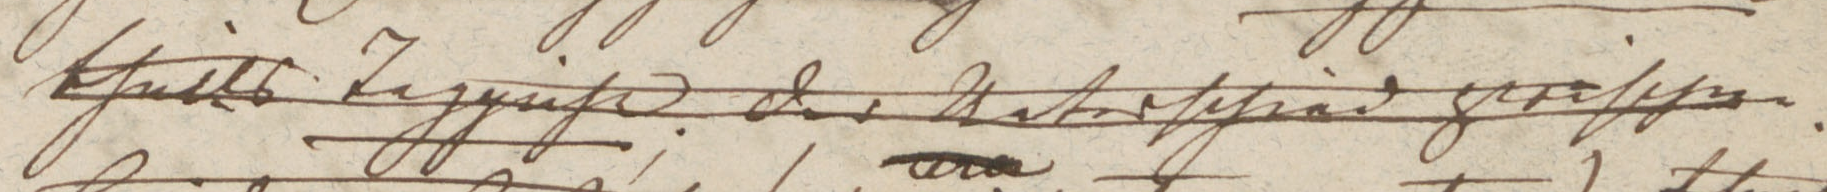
theils Teppiche; der Unterschied zwischen
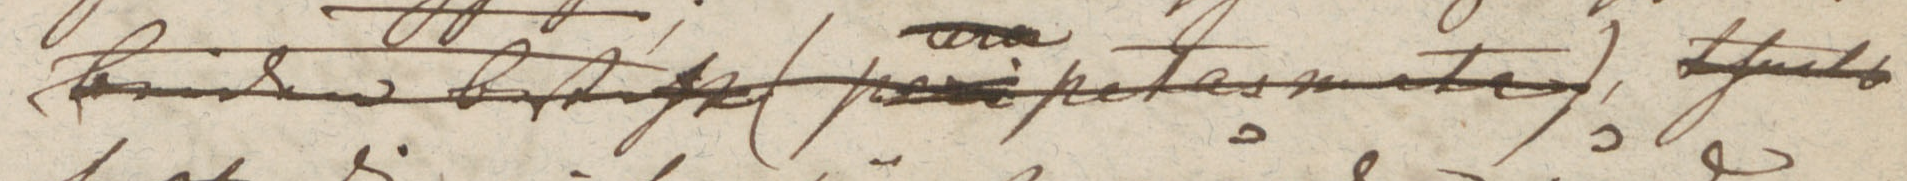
beiden besteht (peri ara petasmata), theils
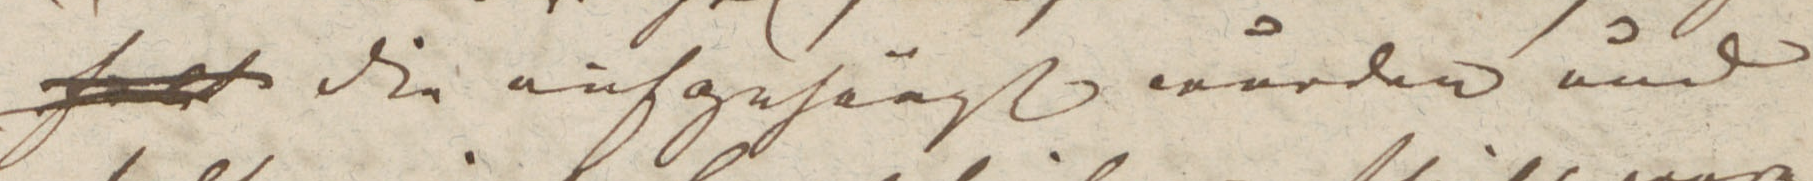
falt die aufgehängt wurden und
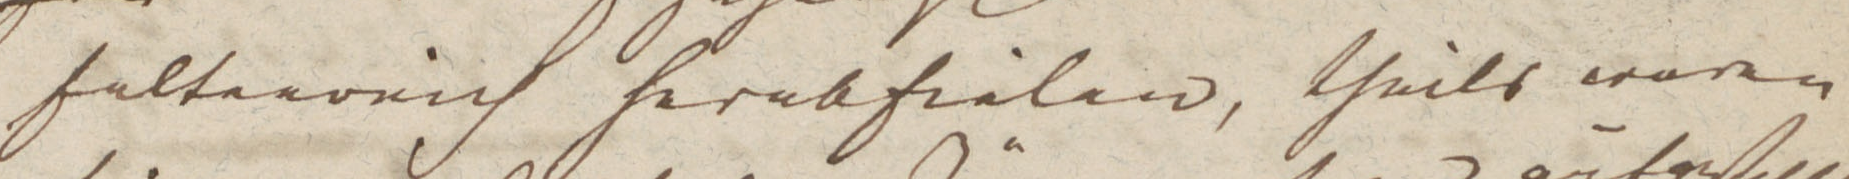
faltenreich herabfielen, theils waren
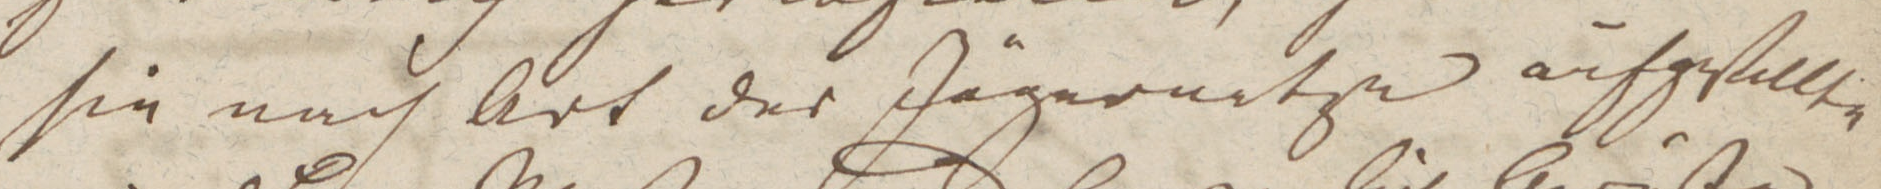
sie nach Art der Jägernetze aufgestellte
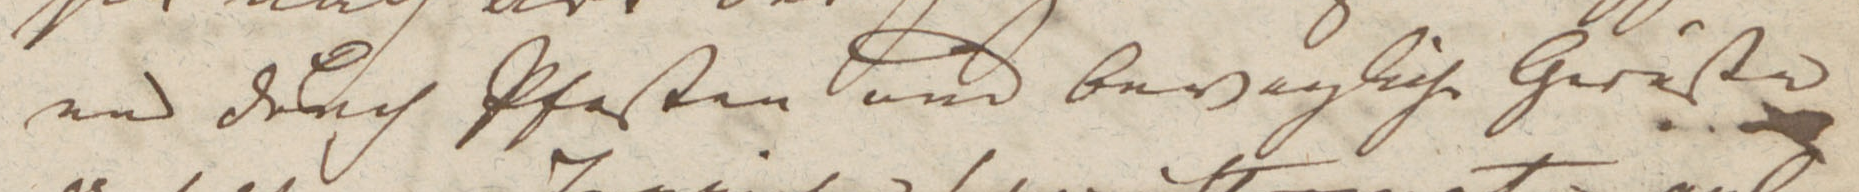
und durch Pfosten und bewegliche Gerüste
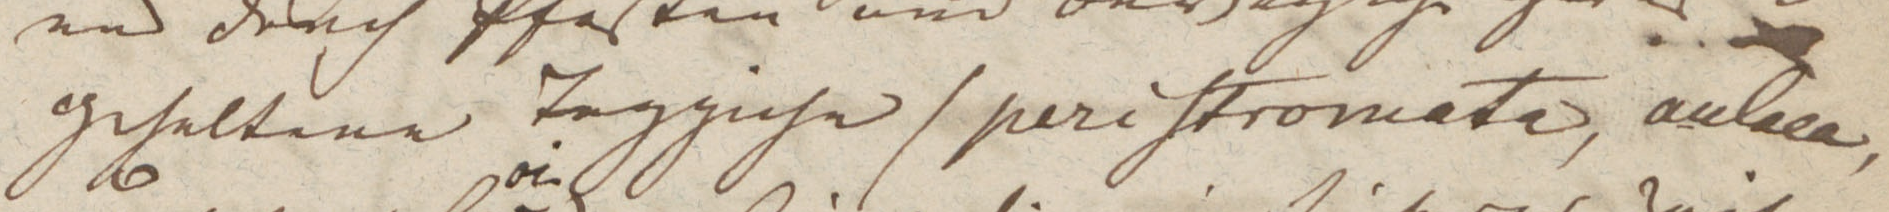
gehaltene Teppiche (peristromata, aulaea,
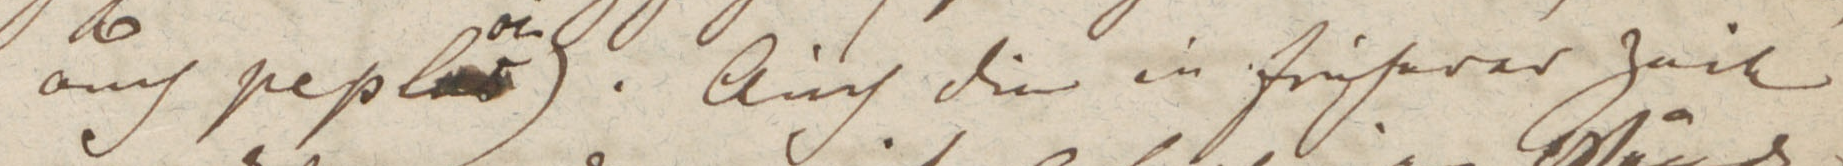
auch peploi). Auch die in früherer Zeit
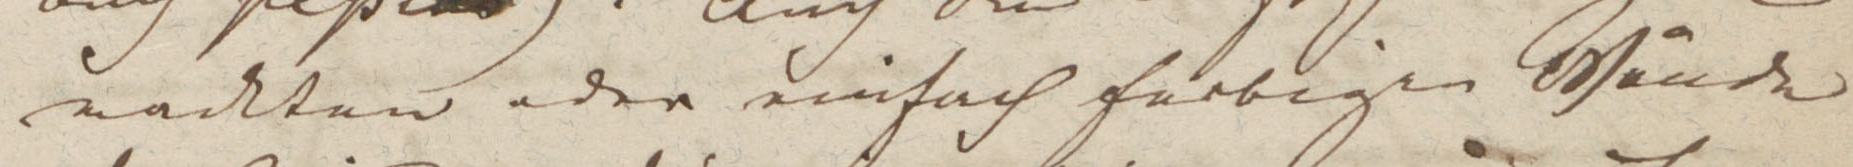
nackten oder einfach farbigen Wände
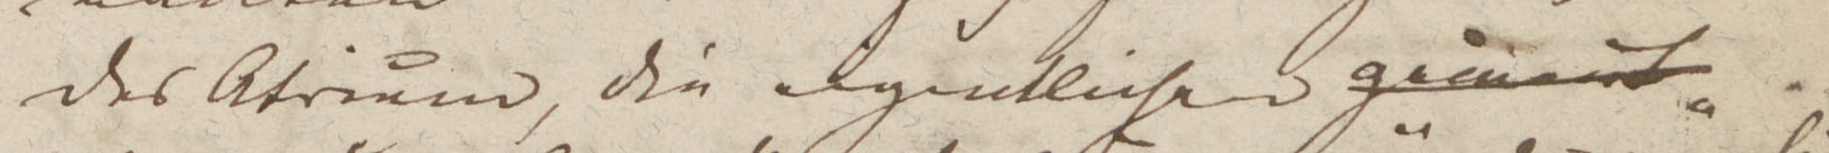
des Atrium, die eigentlichen gemaut
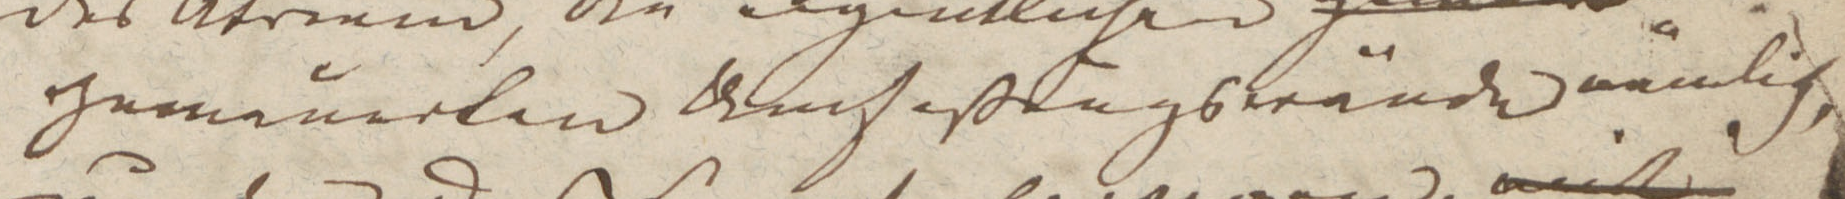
gemauerten Umfassungswände nämlich,
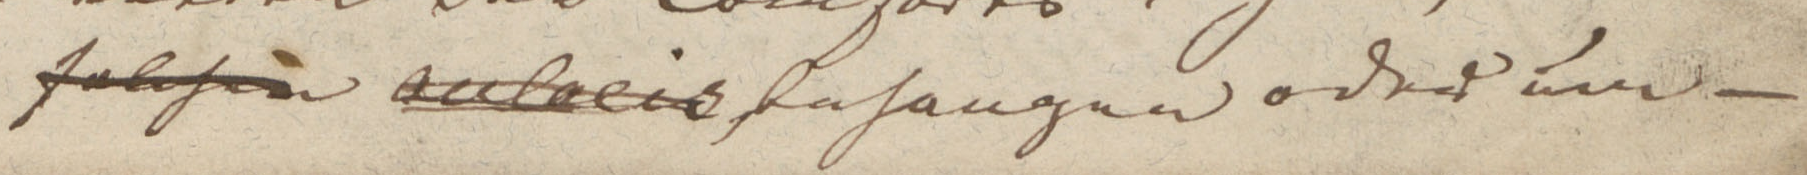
solchen aulaeis behangen oder um-
